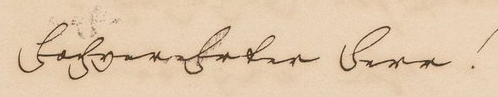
Hochverehrter Herr!
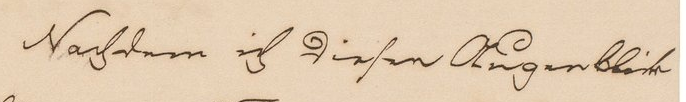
Nachdem ich diesen Augenblick
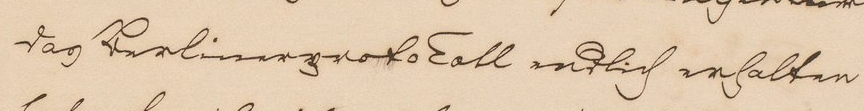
das Berlinerprotokoll endlich erhalten
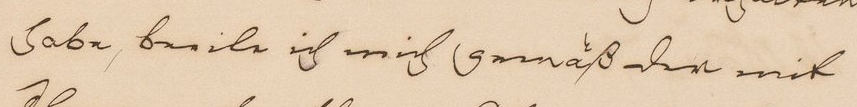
habe, beeile ich mich gemäß der mit
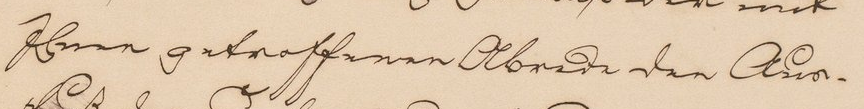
Ihnen getroffenen Abrede den Aus-
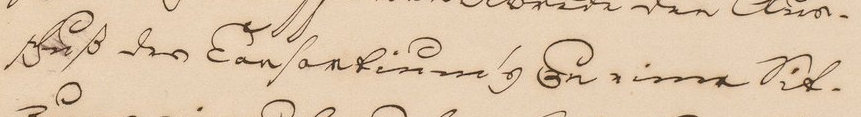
schuß des Consortium's zu einer Sit-
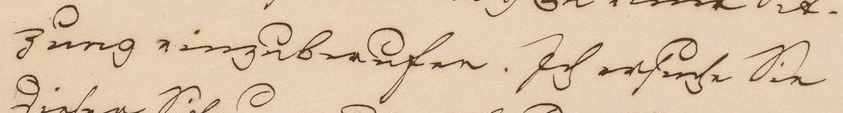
zung einzuberufen. Ich ersuche Sie
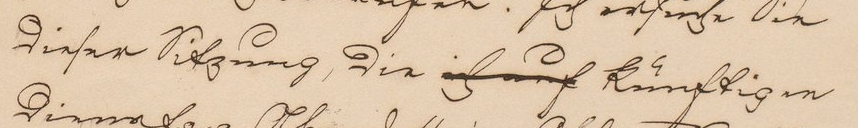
dieser Sitzung, die ich aufkünftigen
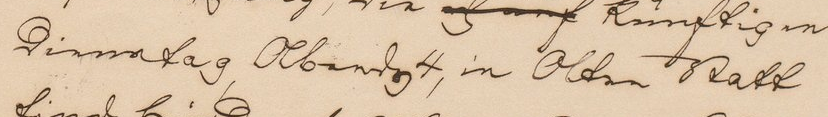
Dienstag, Abends 4, in Olten Statt
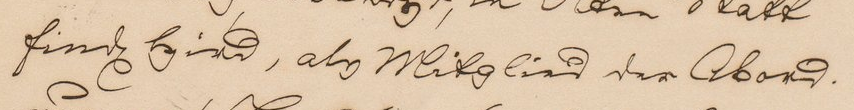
finden wird, als Mitglied der Abord-
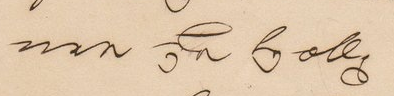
nen zu wollen.
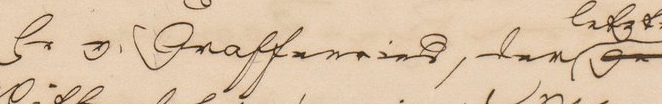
Hr v. Graffenried, der ge-
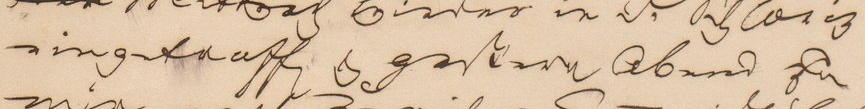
eingetroffen & gestern Abend zu
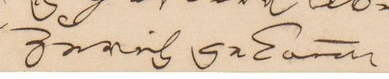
Zürich gekommen
